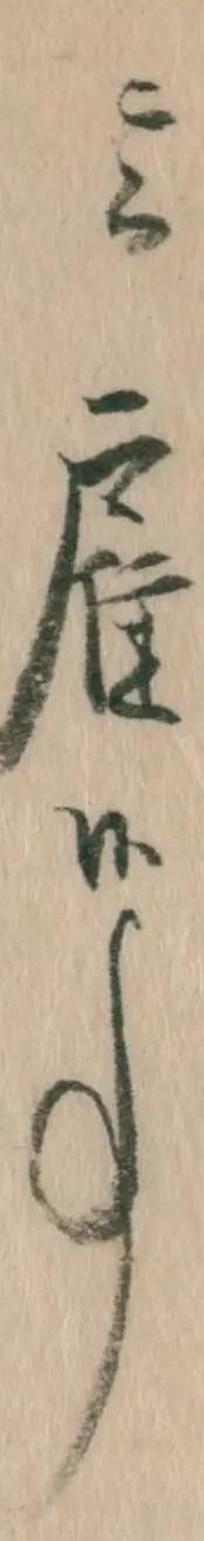ニ而雇候事
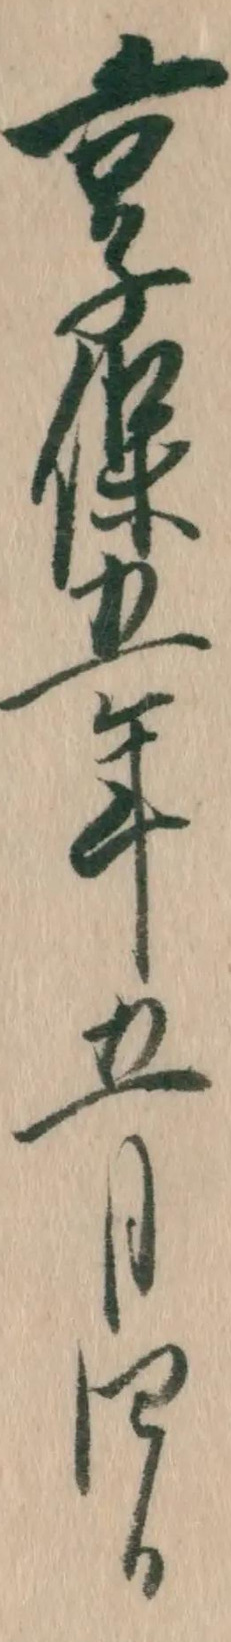享保五年五月四日
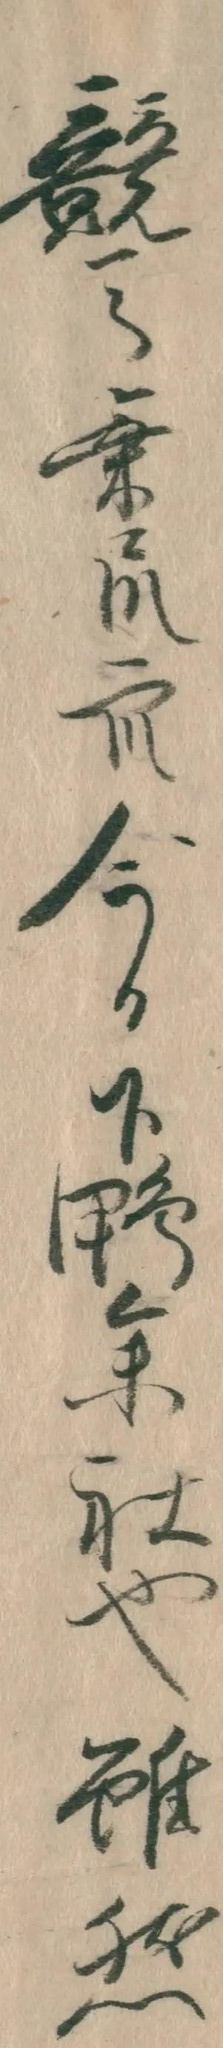一競之乗尻衆今日下鴨参社也雖然
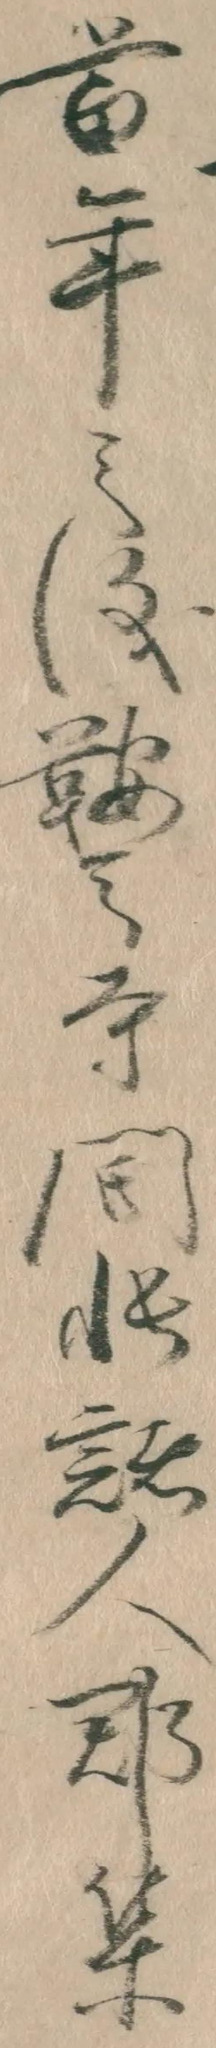当年之儀鞍馬寺開帳諸人郡集
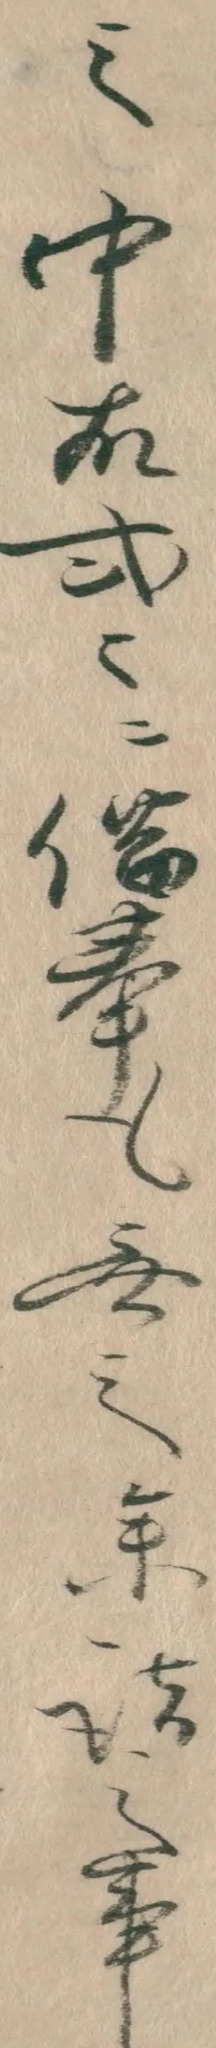之中故式々ニ備奉も無之参詣之事
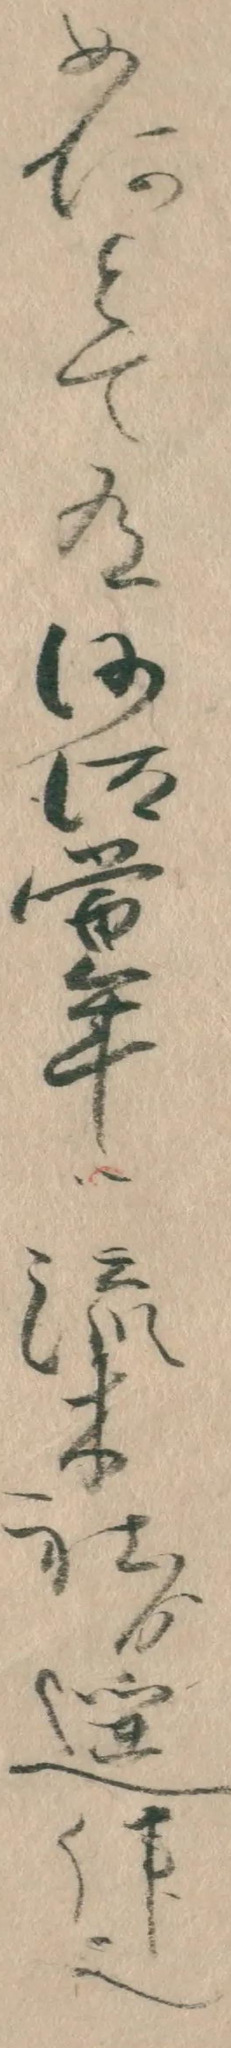如何とて有沙汰当年ハ流木社ゟ遥拝也
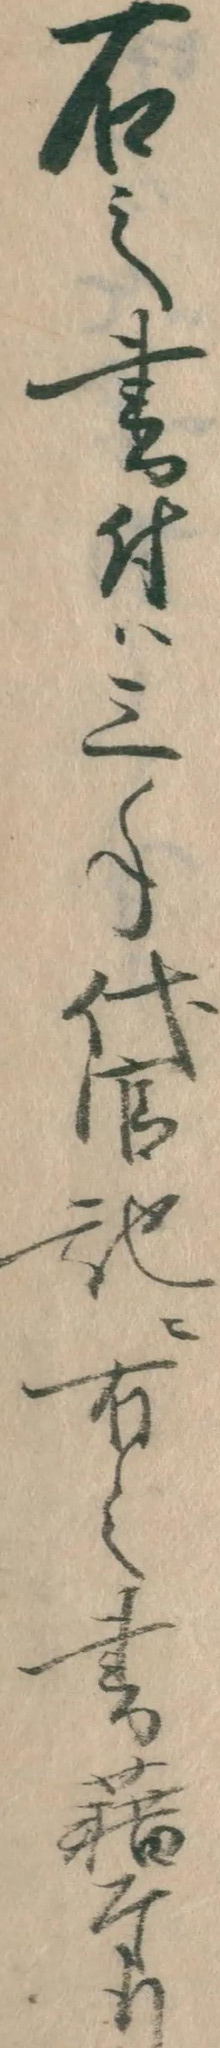右之書付ハ三年代官記ニ有之書籍奉行

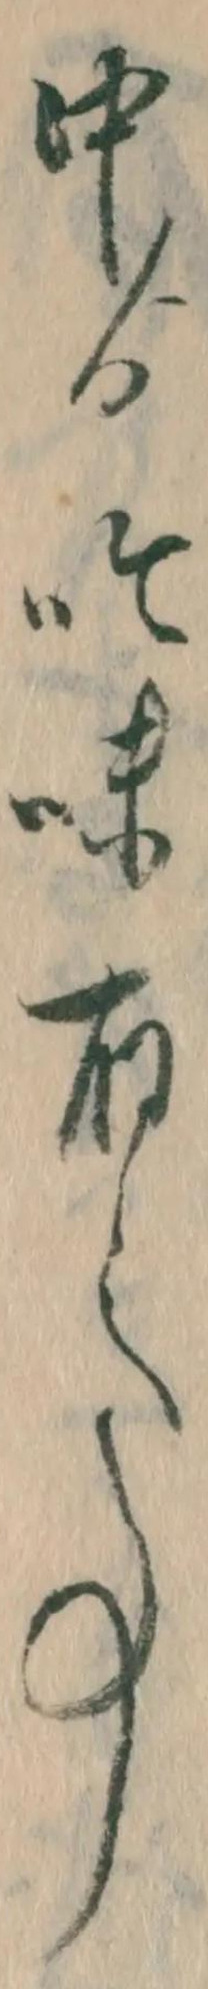中ゟ吟味有之事

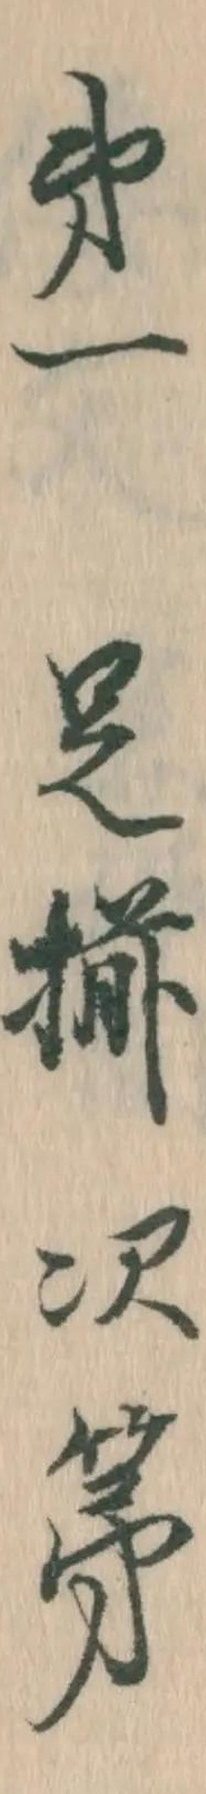第一足揃次第
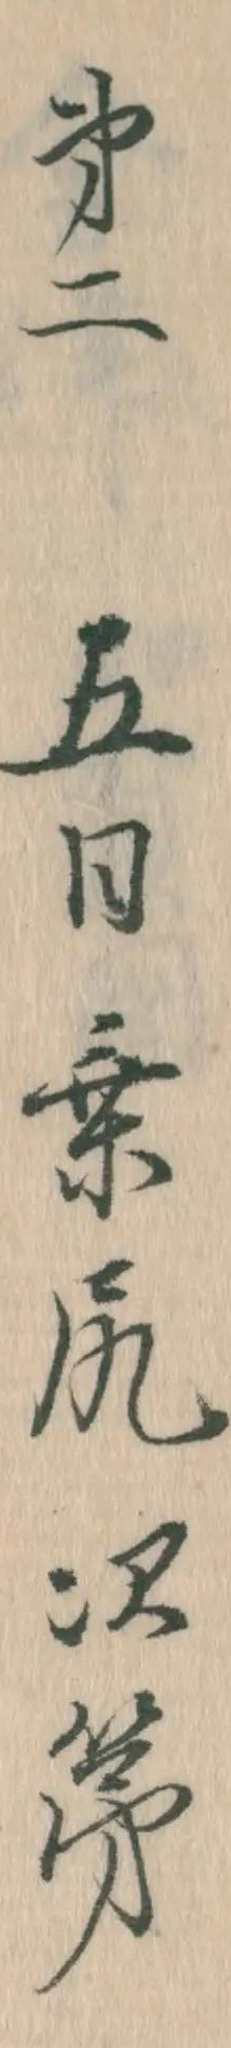第二五日乗尻次第
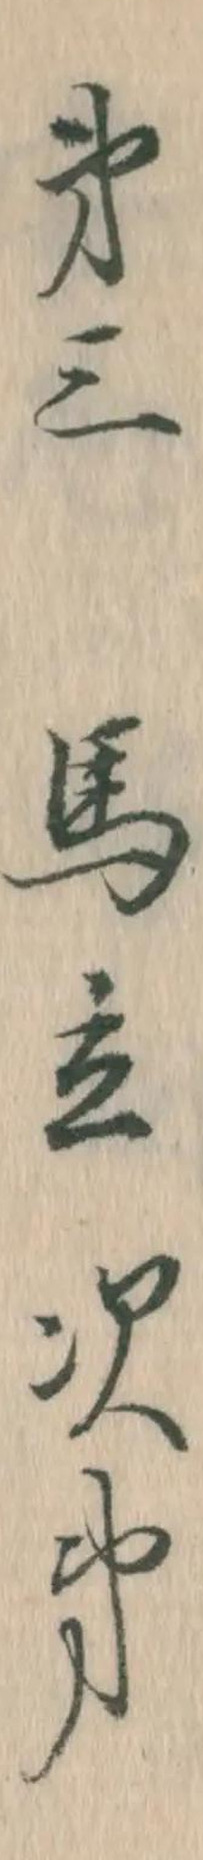第三馬立次第
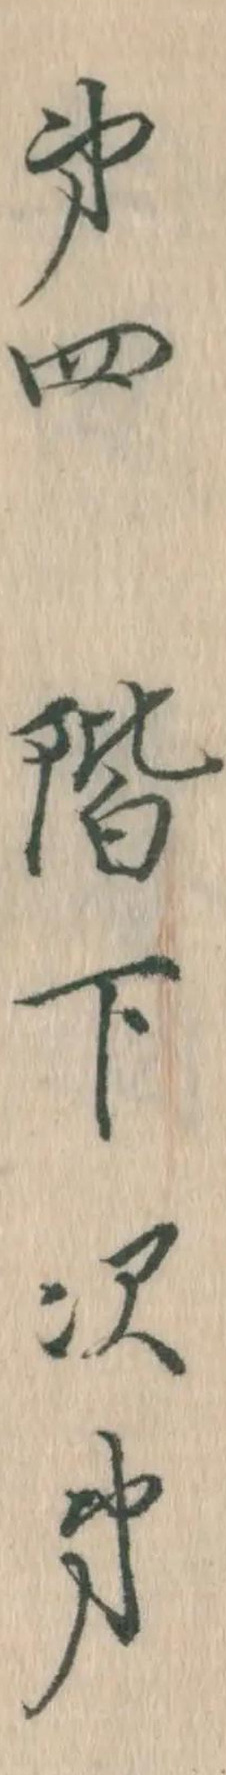第四階下次第
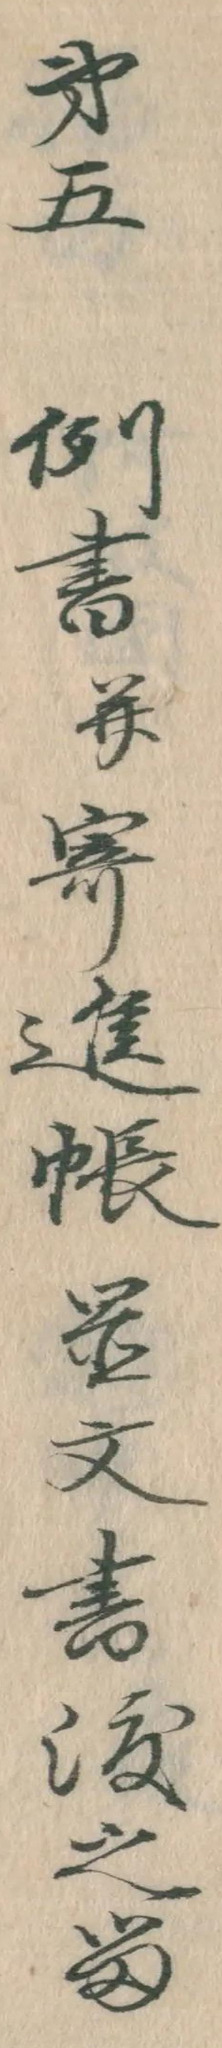第五例書并寄進帳置文書渡之留

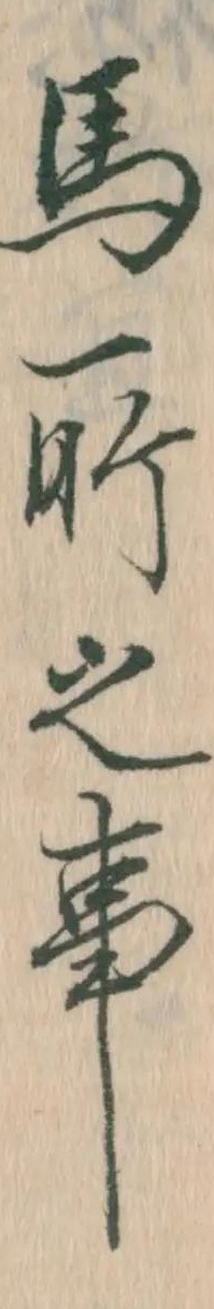馬所之事

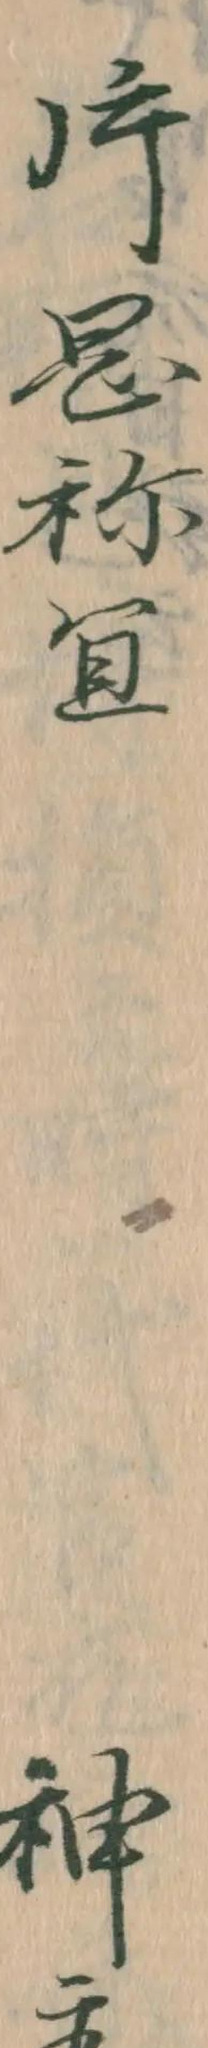片岡禰宜神主
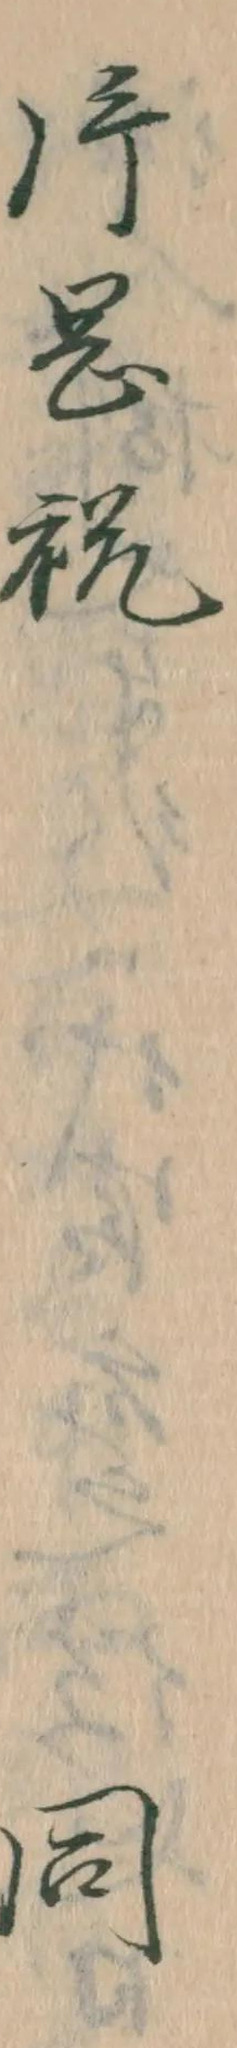片岡祝同
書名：賀茂社記録. 第11冊
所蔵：国立国会図書館 National Diet Library, JAPAN
